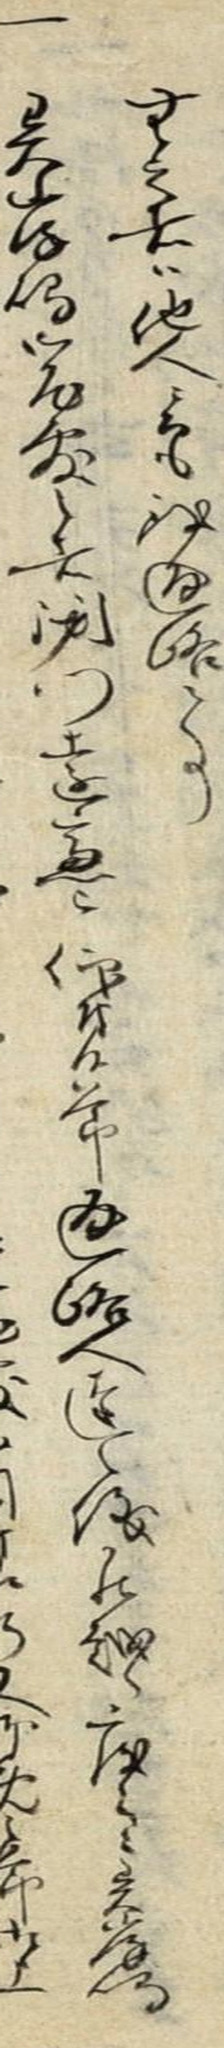一霊岸嶋御屋敷之者閉門遠慮被仰付候節通路人達之儀罷越候度々に霊岸嶋
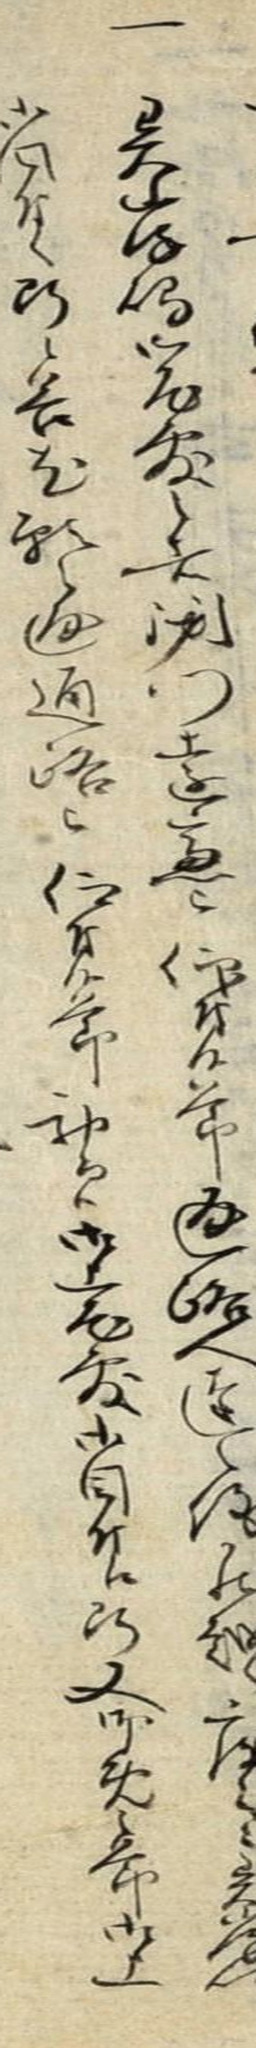御目付へ断候筈尤願之通通路被仰付候節初ては御上屋敷御目付江断又御免之節御上
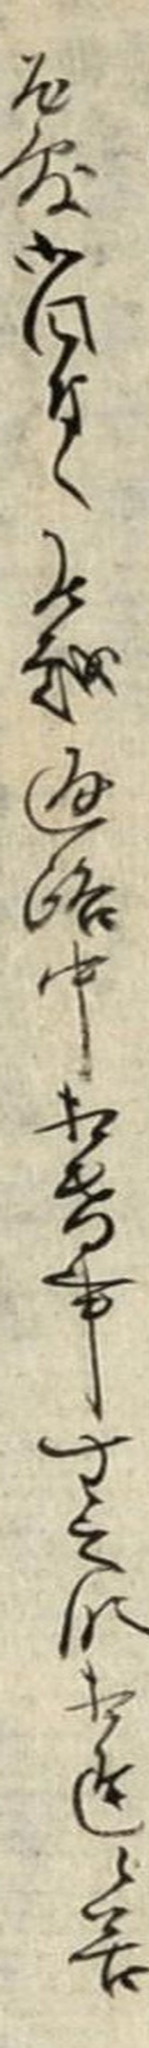屋敷御目付へ罷越通路中相替事無之段相達候筈
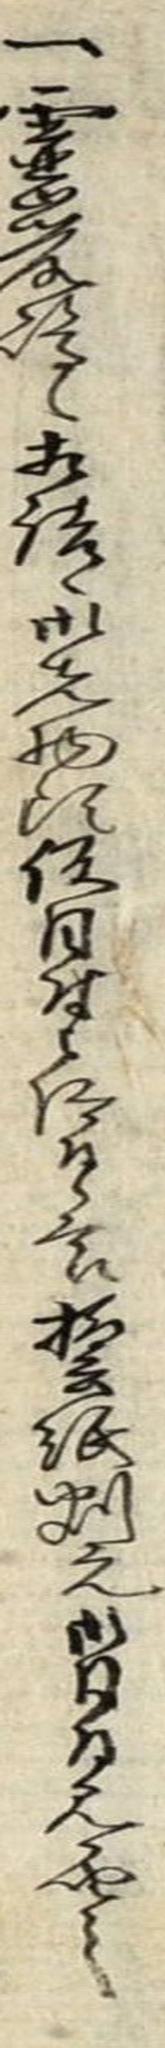一霊岸嶋へ相詰候御先物頭仮目付被仰付候節誓紙判元御目付見届之
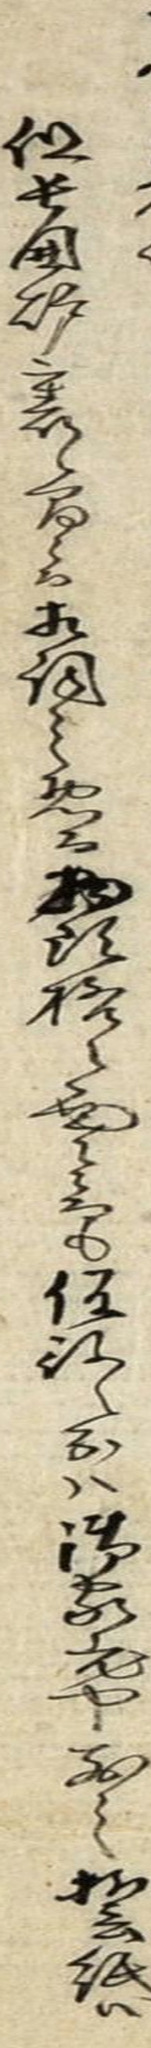但長囲炉裏之間にて相調之惣て物頭格之面々にても仮役之分は御家老中前之誓紙は
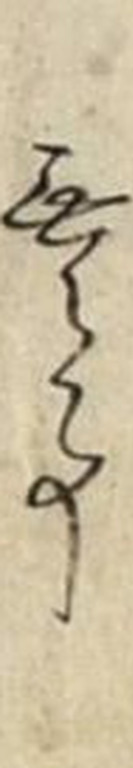無之事
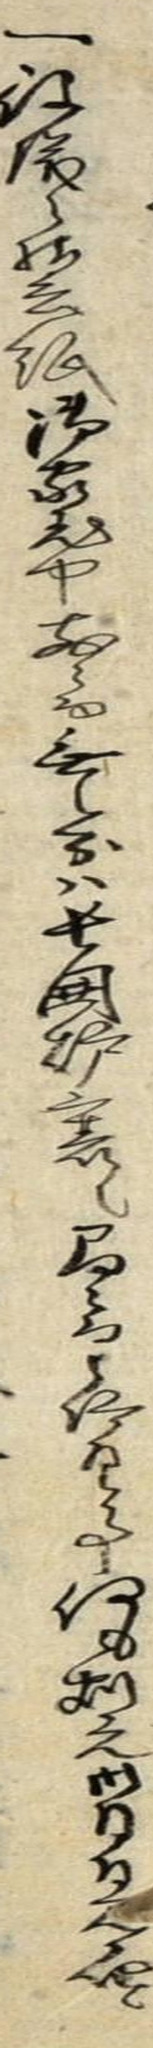一役儀之誓紙御家老中前にて無之分は長囲炉裏之間にて被仰付候事何も判元御目付見届候
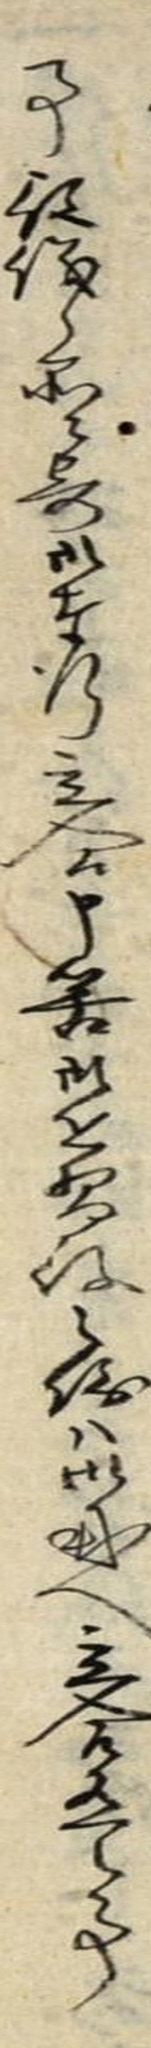事役儀之品に寄御奉行立合申筈御近習役之儀は御用人立合有之事

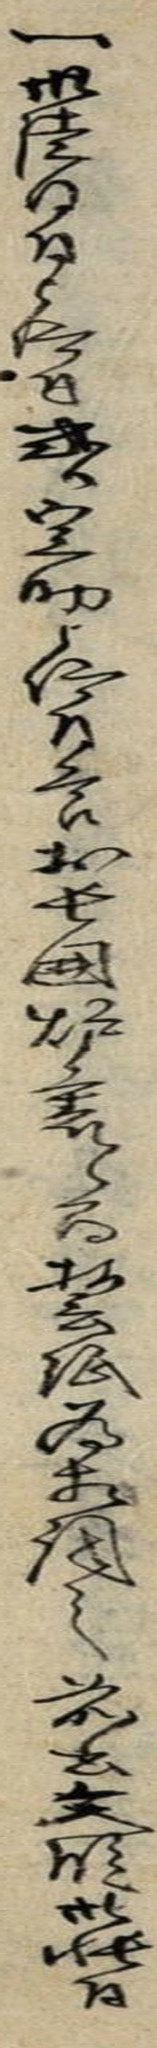一御徒目付被仰付或は定助被仰付候節於長囲炉裏之間誓紙為相調之前書文段御帳付
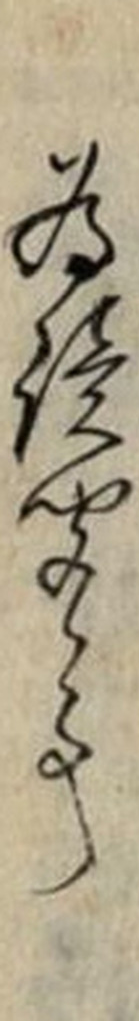為読聞候事
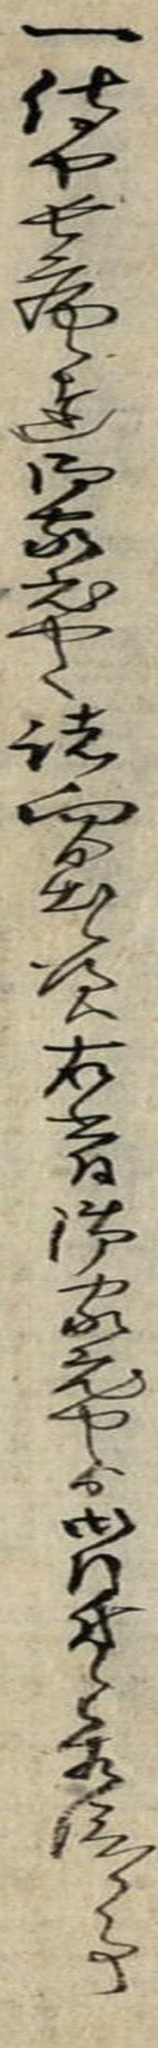一侍中長病へ達御家老中へ諸向ゟ出候得は右書付御家老中ゟ御目付へ被相渡候事
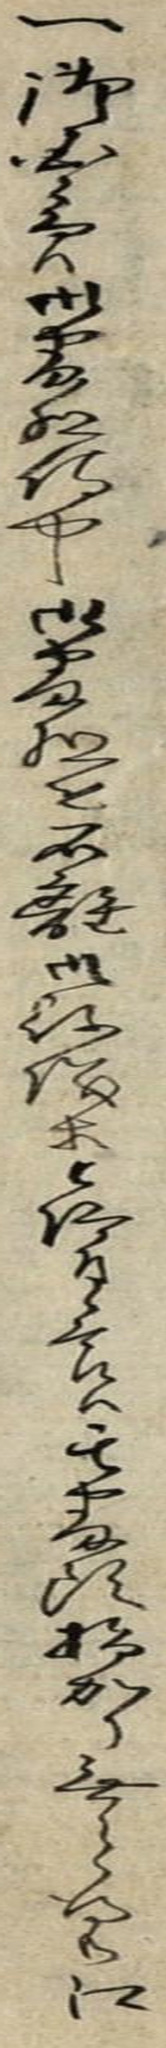一御国にては御番組侍中御番組を不離御役儀等被仰付候節は其番頭指加り無之候得共江
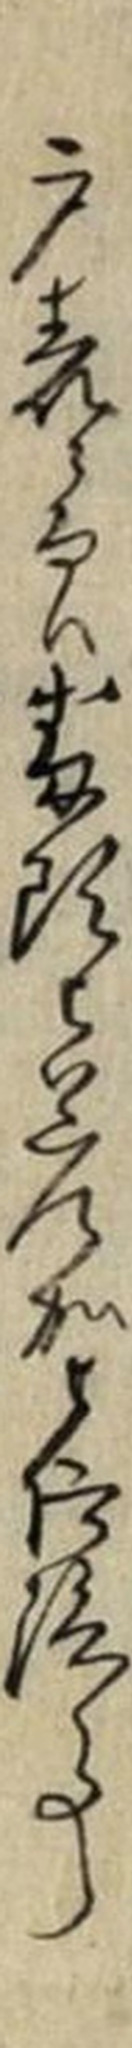戸表にては番頭被差加被仰渡事
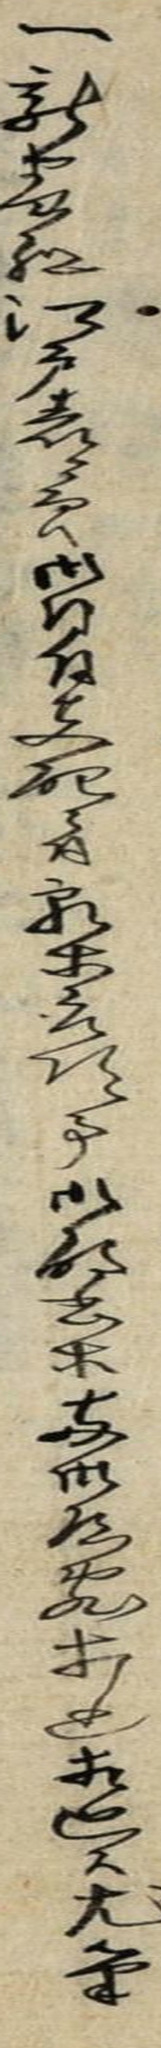一新番組江戸表にては御目付支配に付願等取次候事御触書等両御屋敷打込相廻す尤筆
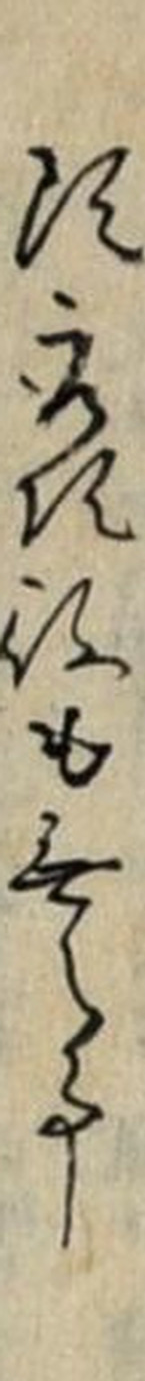頭取次役も無之事
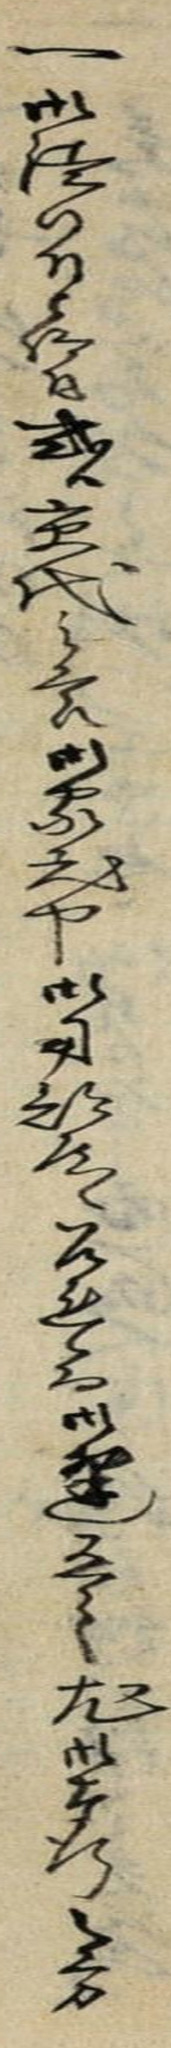一御徒目付被仰付或は交代之節御家老中御用部屋へ召連候て御逢有之尤御奉行之方
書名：三都并道中之部
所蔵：福井県文書館 Fukui Prefectural Archives
